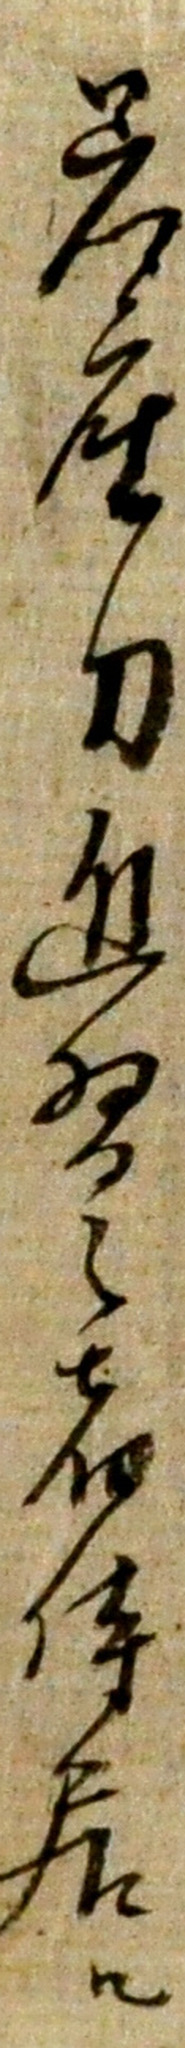着座刀近習之者侍居候
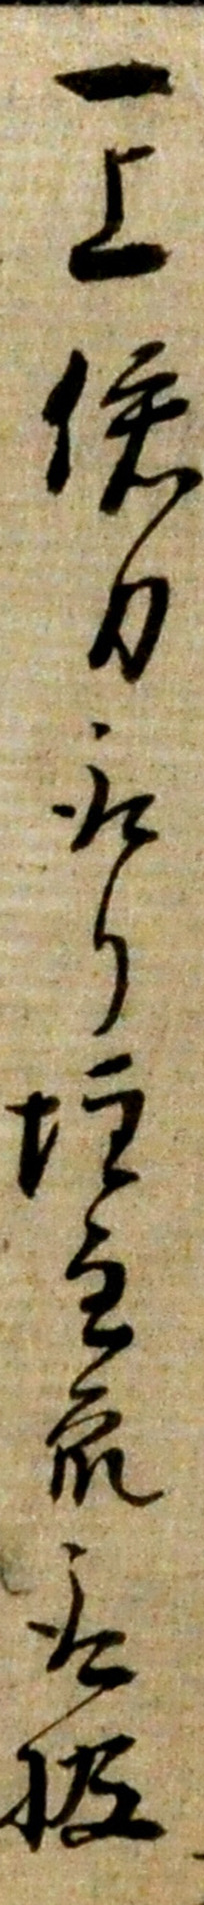一上使刀取り坊主衆取扱
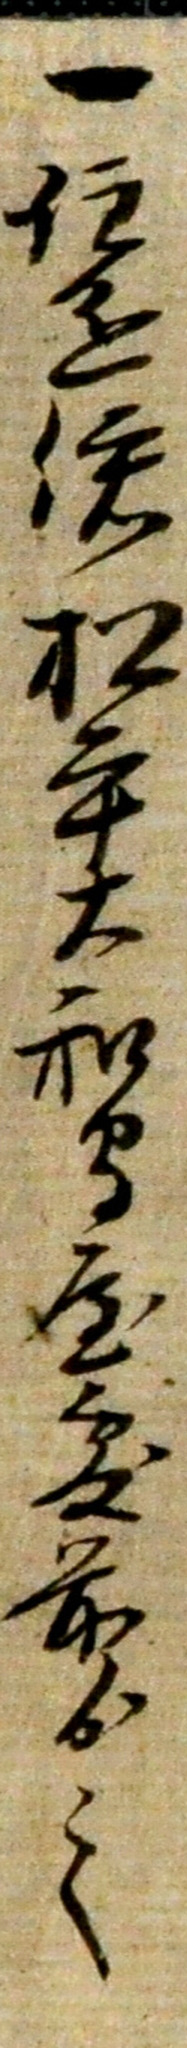一注進使松平大和守屋敷前ゟ之
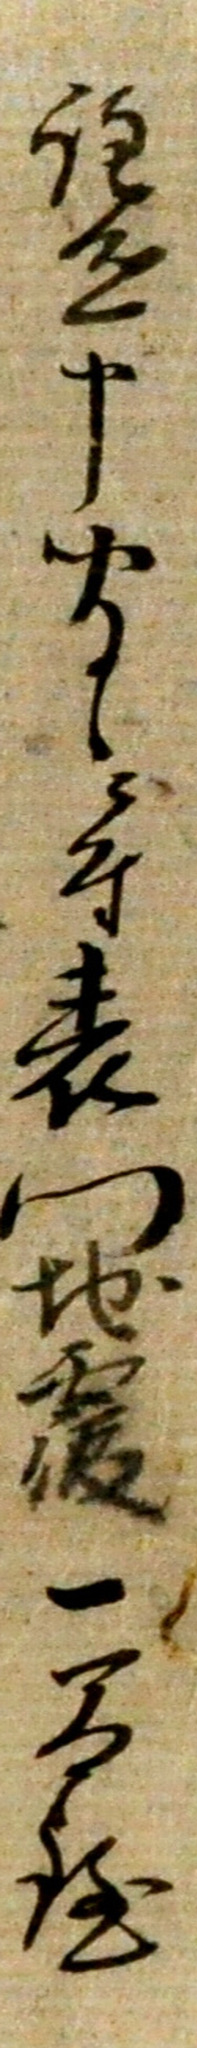注進申聞候ニ付表門地覆一間程
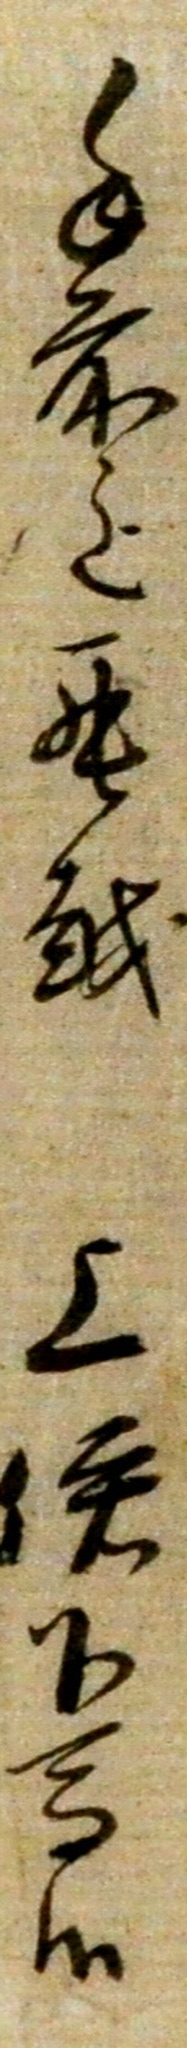手前迄罷越上使下馬候
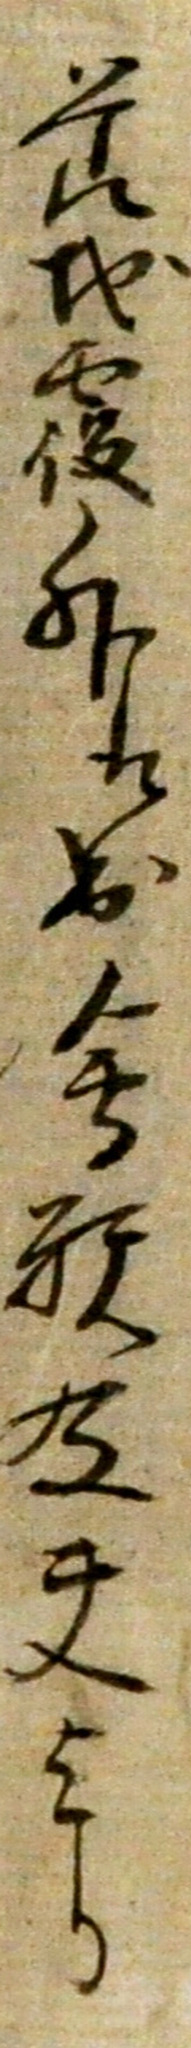節地覆外え出会釈及夫より
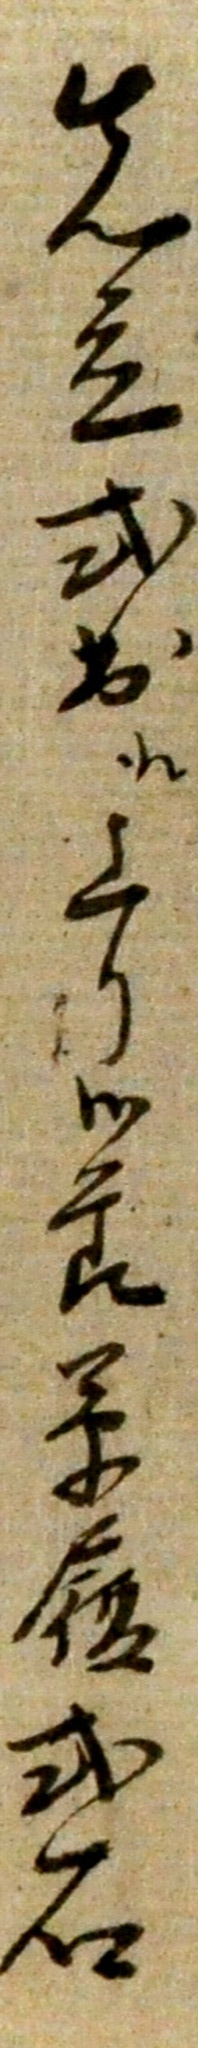先立式出え上り候節草履式石
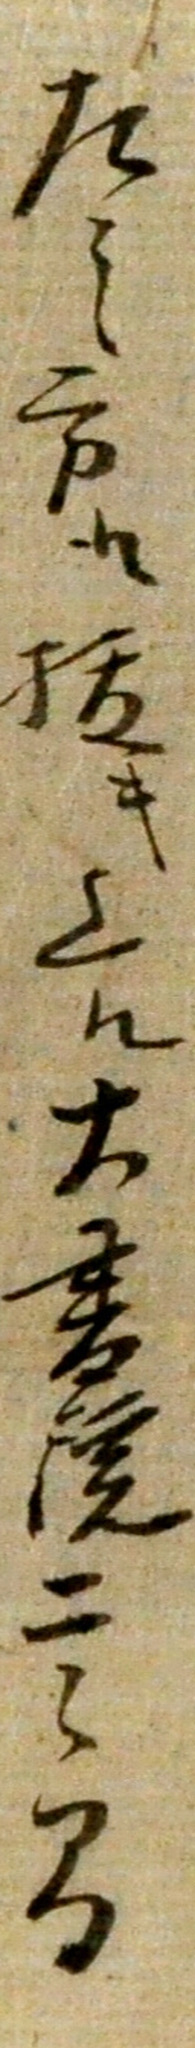左之方え抜キ上候大書院ニ之間
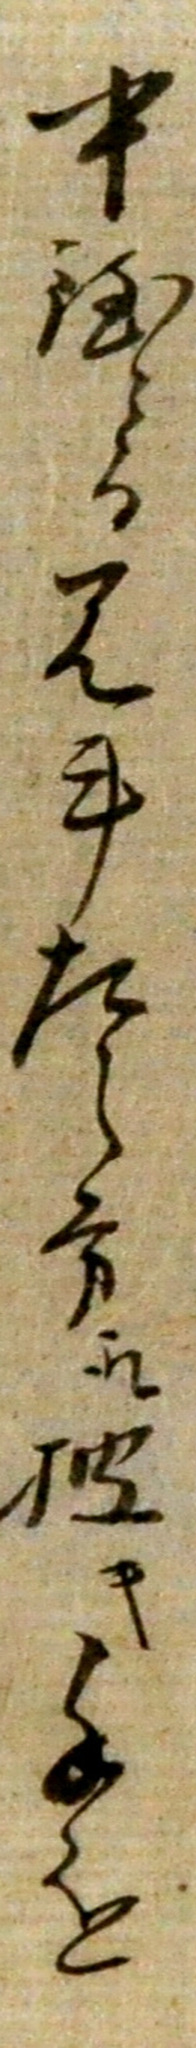中程ニ而見計左之方え披キ手を
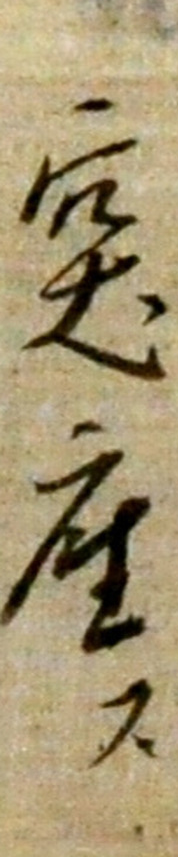突座ス

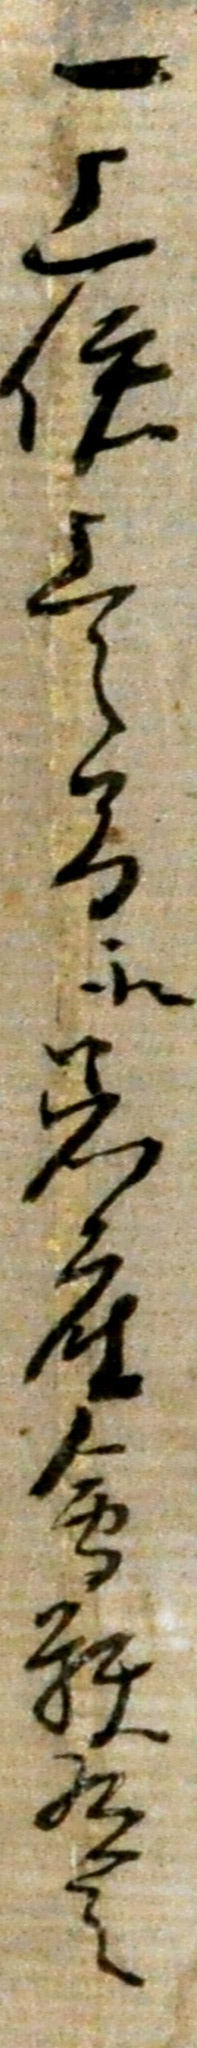一上使上之間え着座会釈有之
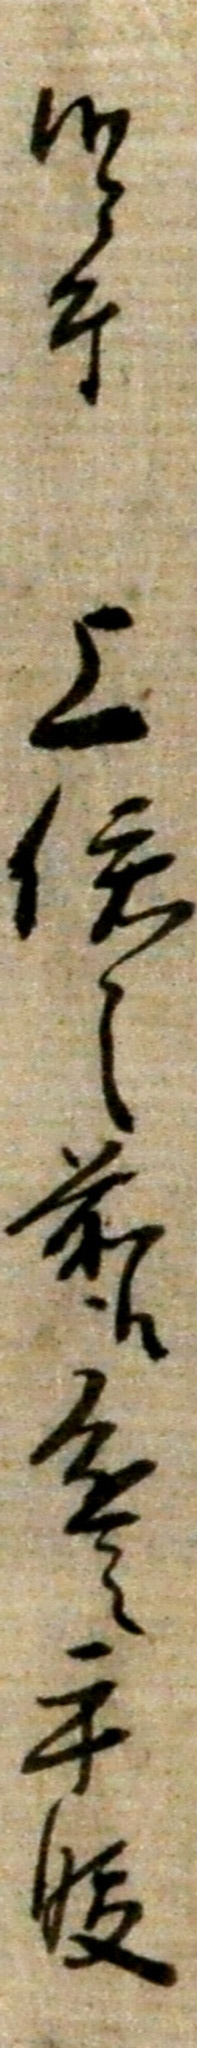候ニ付上使之前え進ミ平服
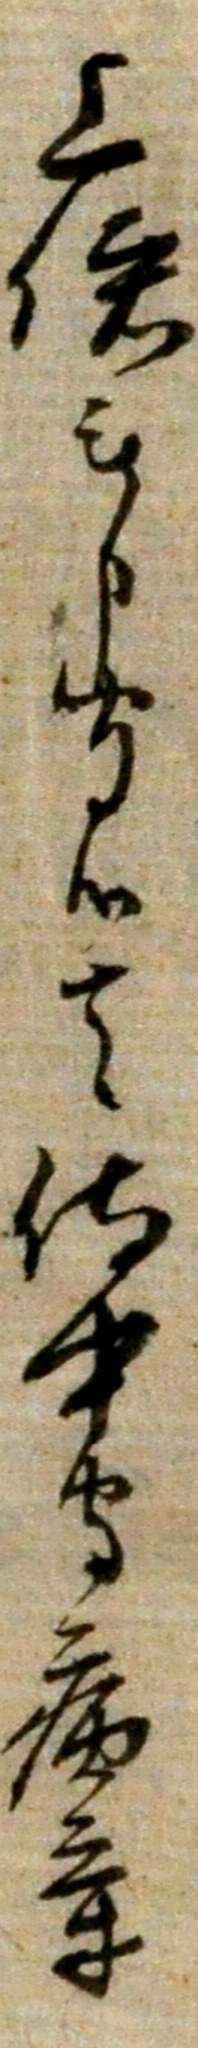上使被申聞候は備中守病気
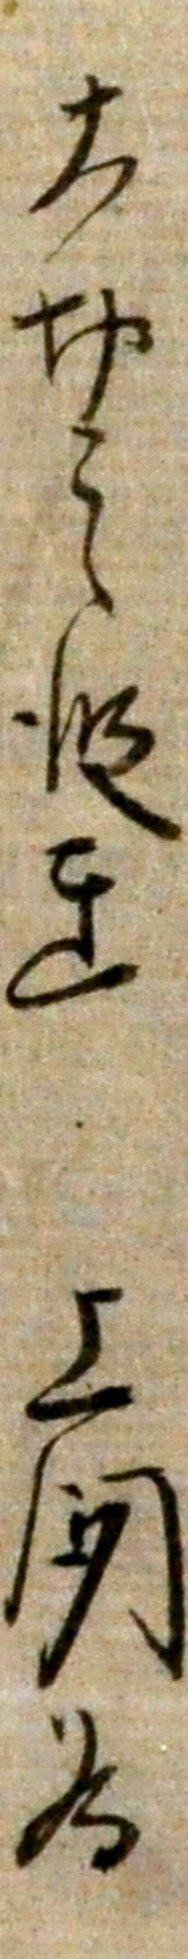大切之段達上聞為
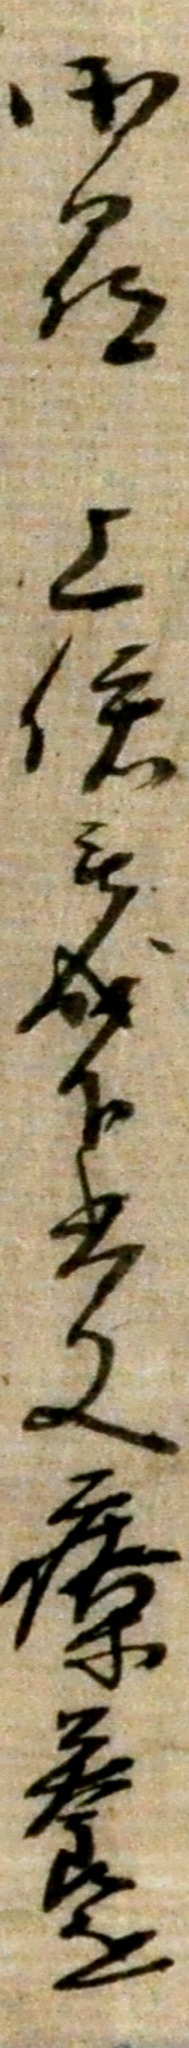御尋上使被成下尚又療養を
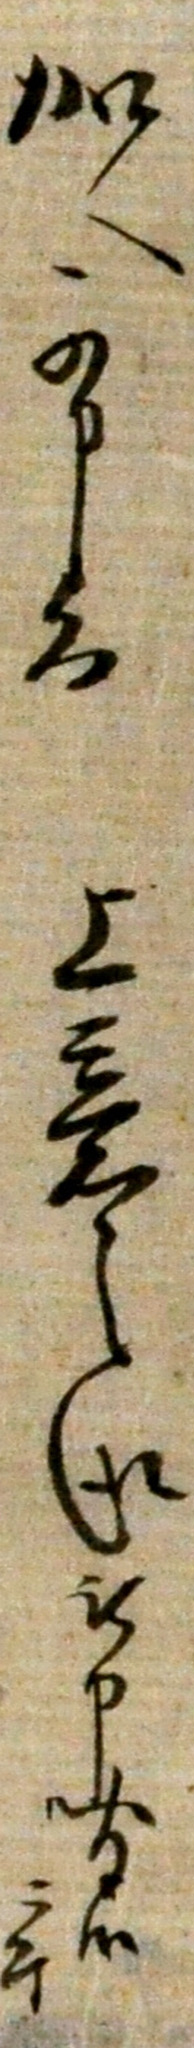加へ可申旨上意之趣被申聞候ニ付
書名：上使仰付ラレ候節ノ留外
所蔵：伊那市立高遠町図書館・合同会社AMANE
